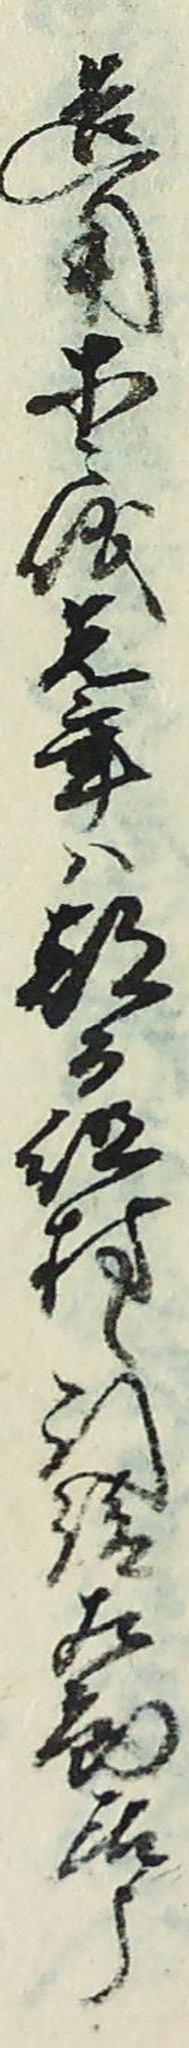造用等の儀先年は都て組村々引請相勤居申
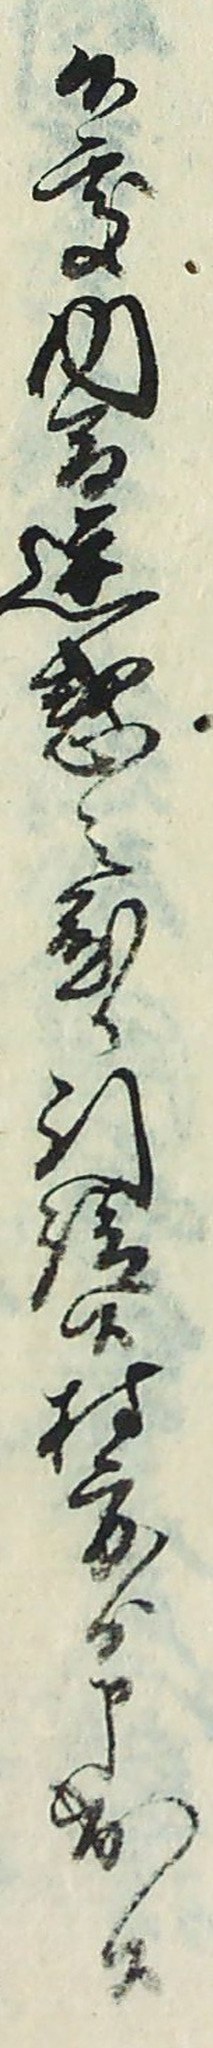候処内間迷惑の懸り引請候村方より申出候
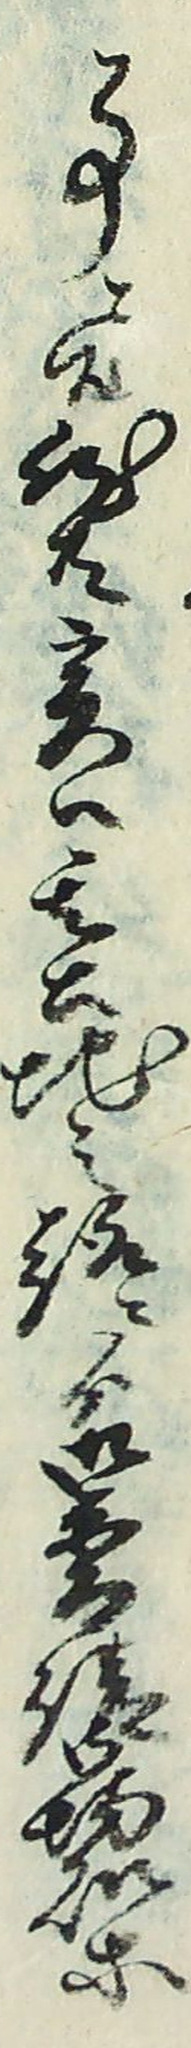事に候然共実は其土地の趣により御普請御場処等
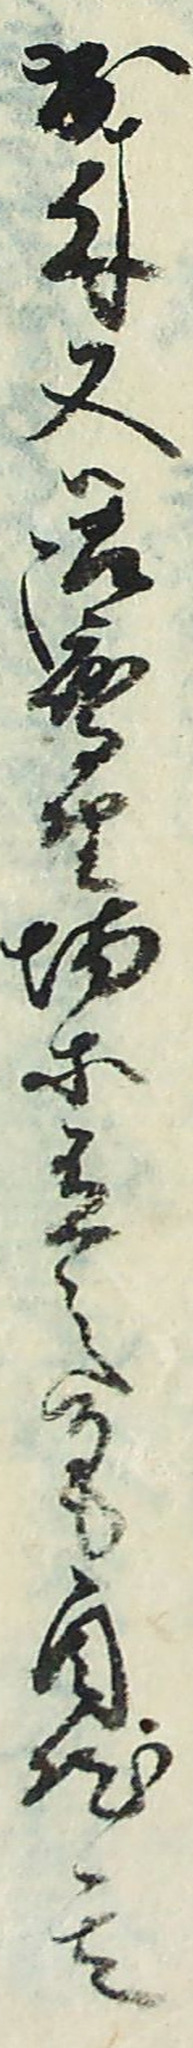出来又は御鷹野場等有之候も自然其
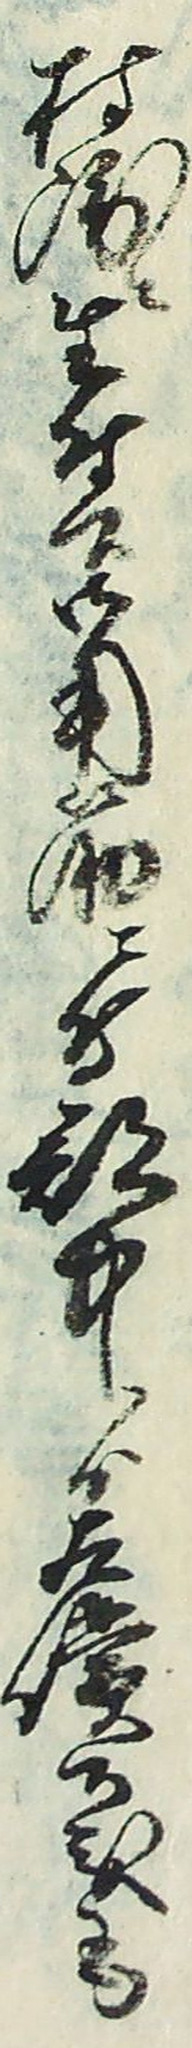村浦に生付候御用筋に付郡中より相償候義にも
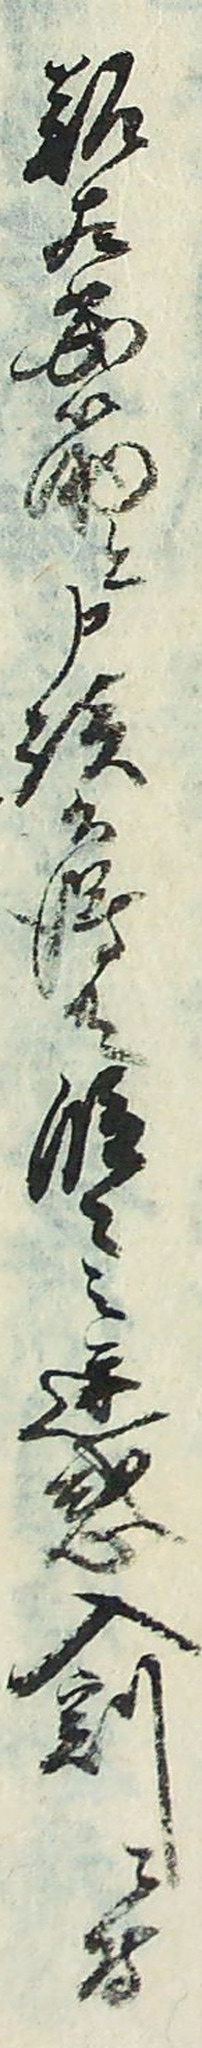難相当筋と申談候得共段々の迷惑入割に付

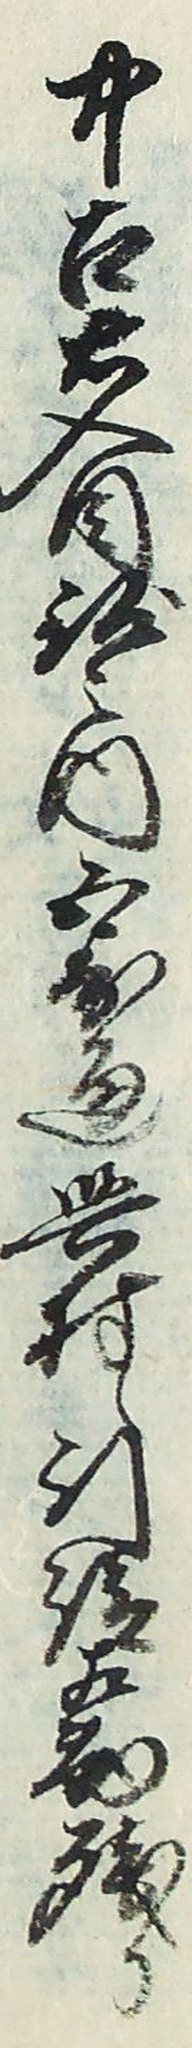中古右入目銀の内五歩通與村へ引請相勤残り
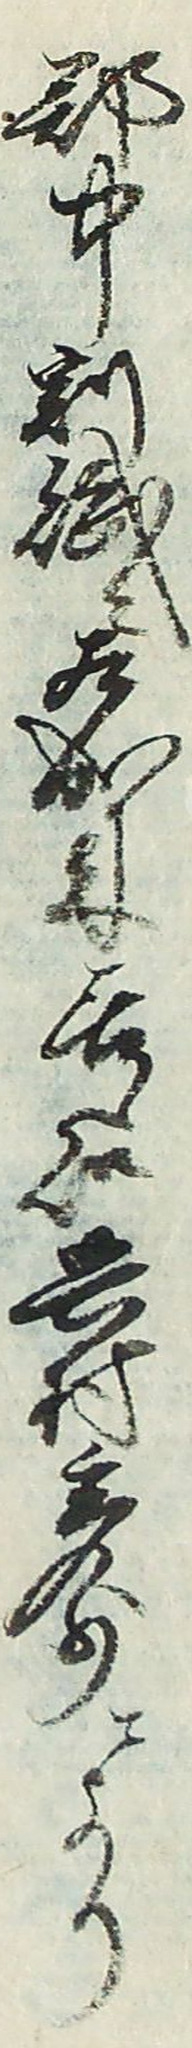郡中割賦に相成来筈候処與村多少により
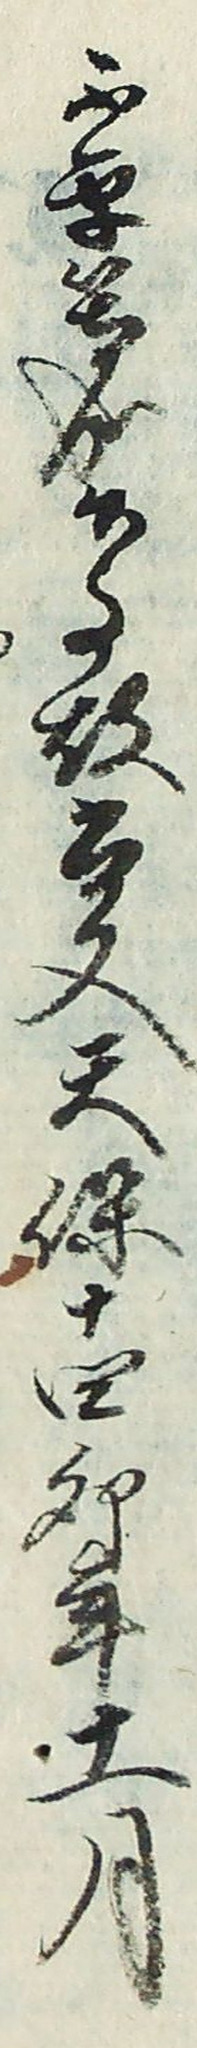不平等成候事故尚又天保十四卯年十一月
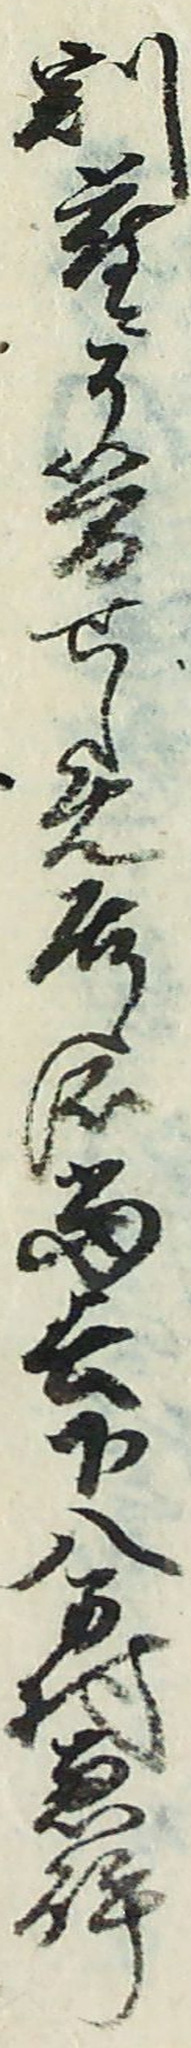割符に了簡せしめ居候所当春下八万村恵解
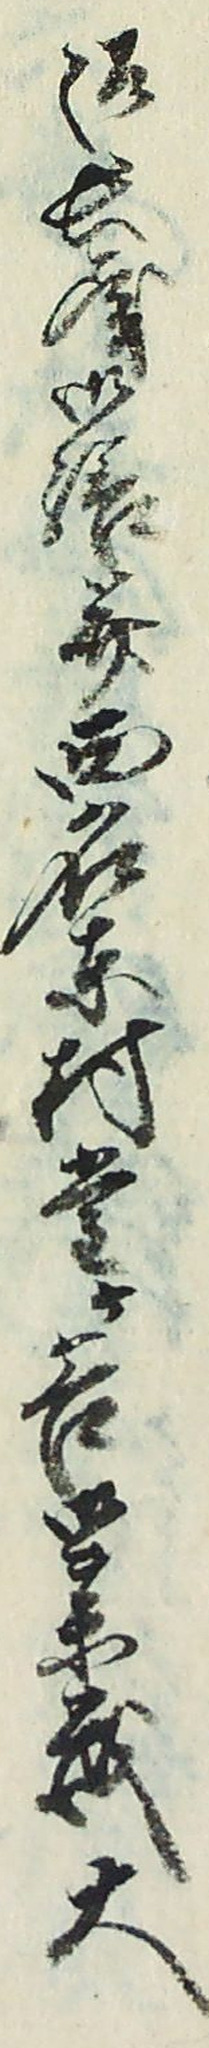御長屋御繕幷西名東村堂ケ谷御茶蔵大
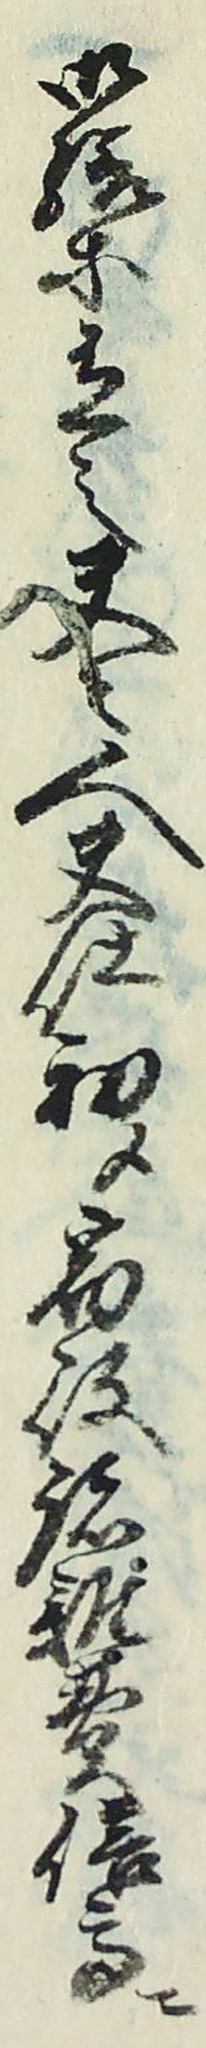御繕等有之夫々人夫仕初め宿役諸雑費倍高に
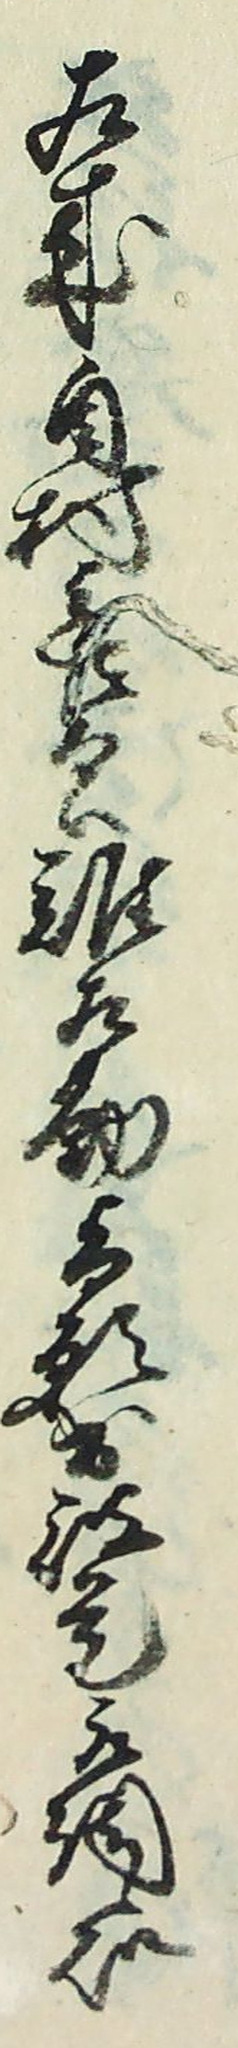相成自村迄にては難相勤旨願出彼是取調候処
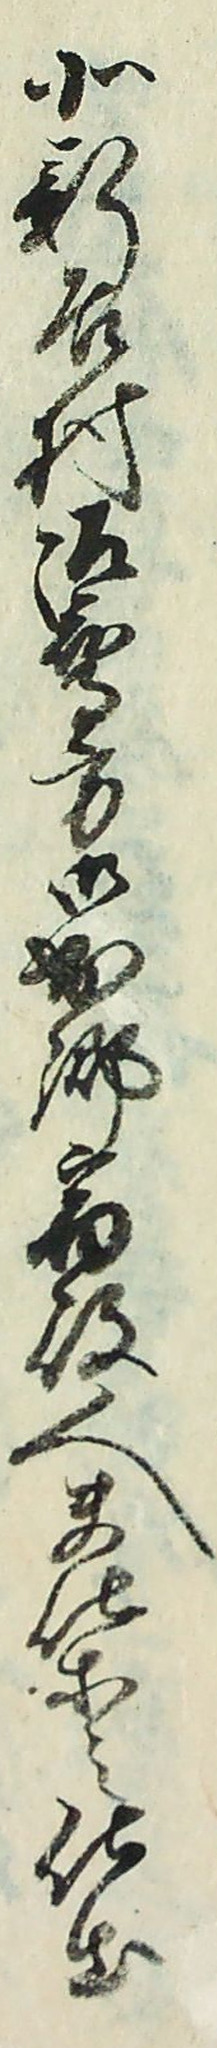北新居村御鷹方御出郷宿役人夫仕等の仕出
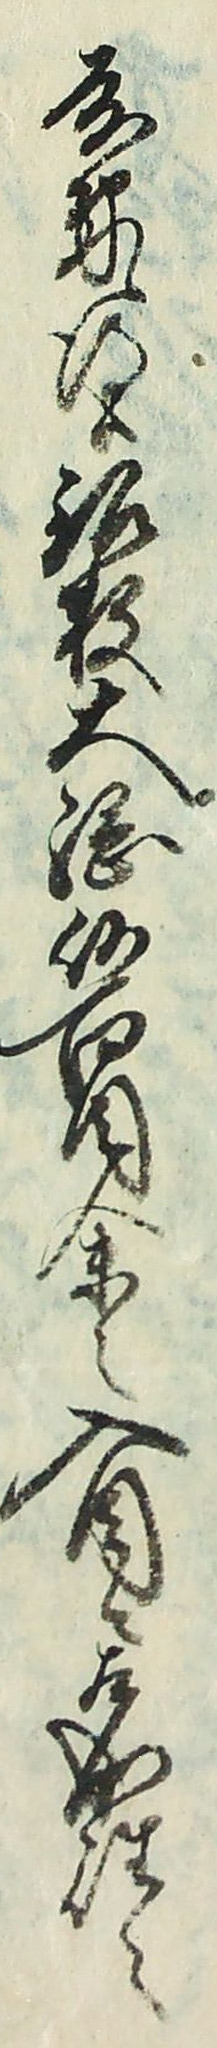取束候得は銀数大綱何百目余の入目に相成往々
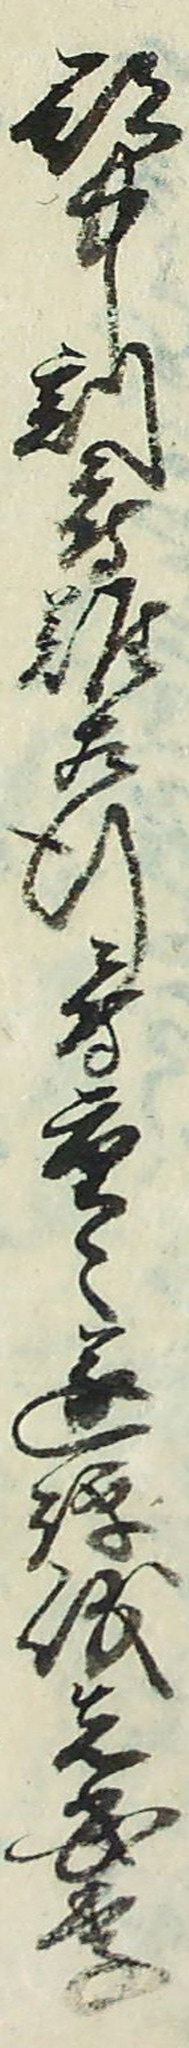郡中割符難相行に付重々遂評儀先当季
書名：諸割賦物賃銀定記録帳
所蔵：鳴門教育大学 Naruto University of Education
